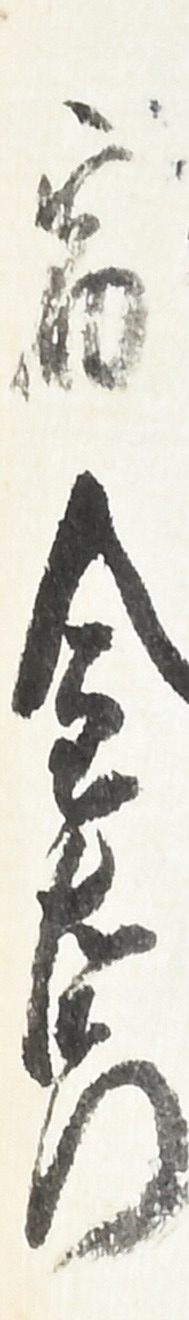宿金右衛門

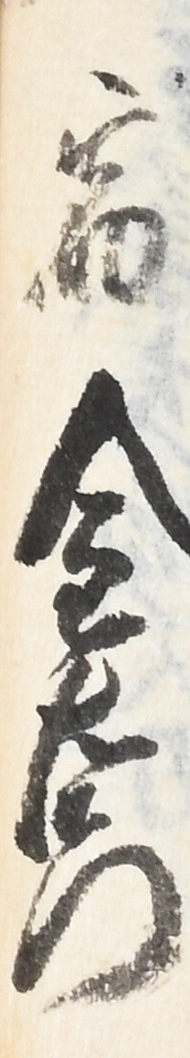宿忠左衛門
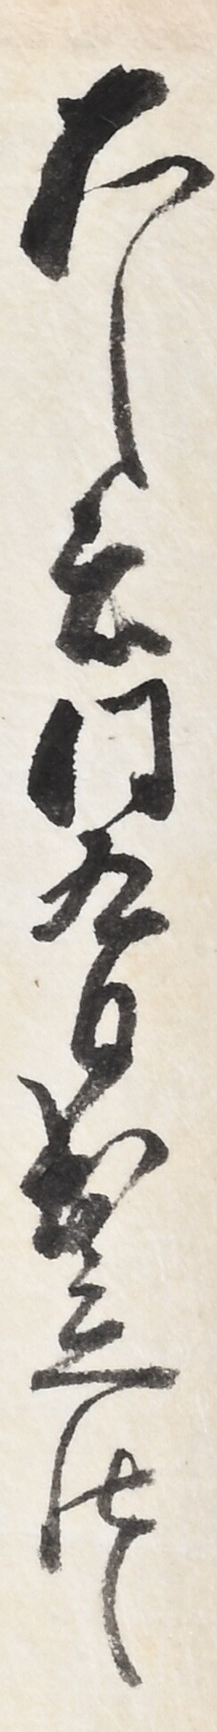右之者同九日出立仕候
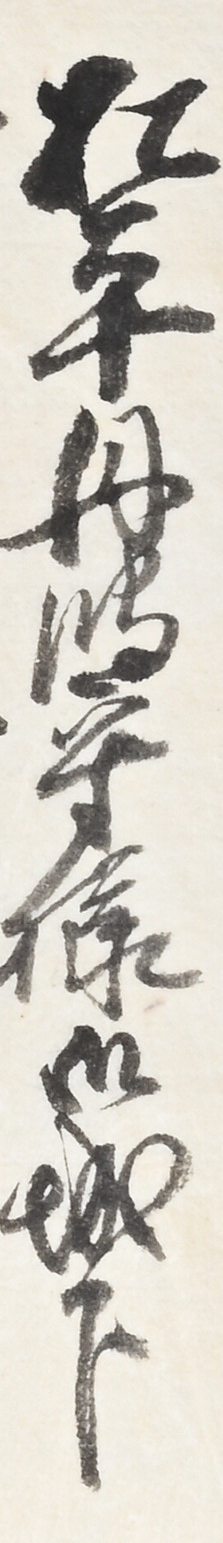松平丹波守様御城下
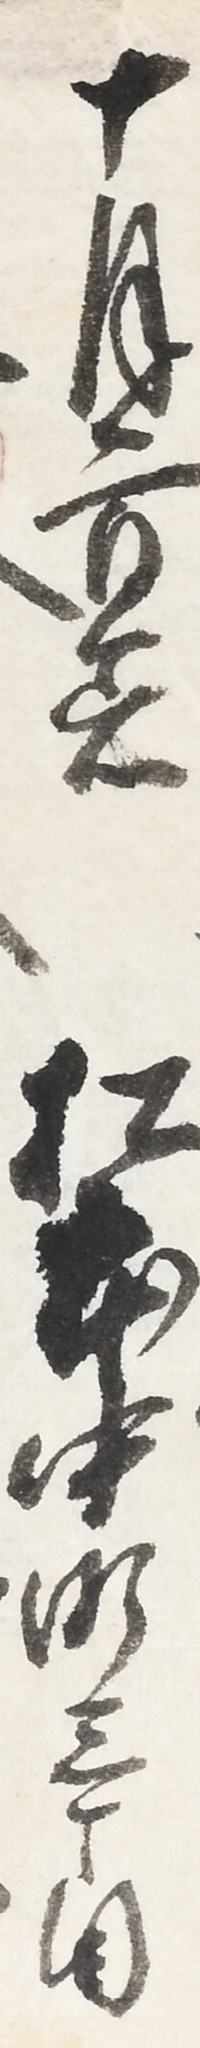十月二日着松本中町三丁目
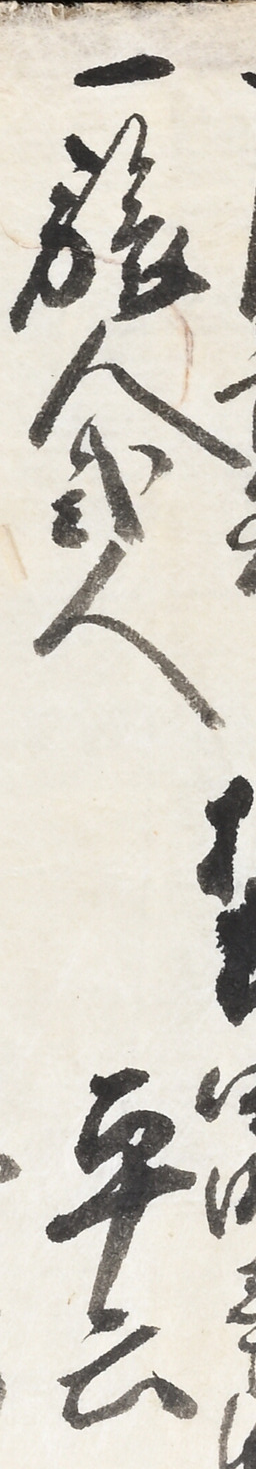一旅人弐人平六
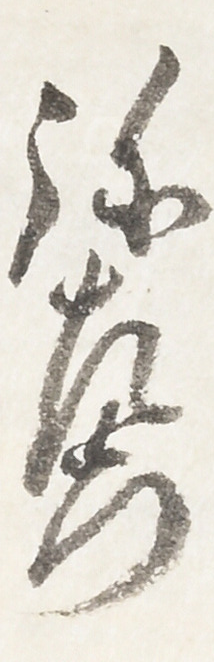弥左衛門
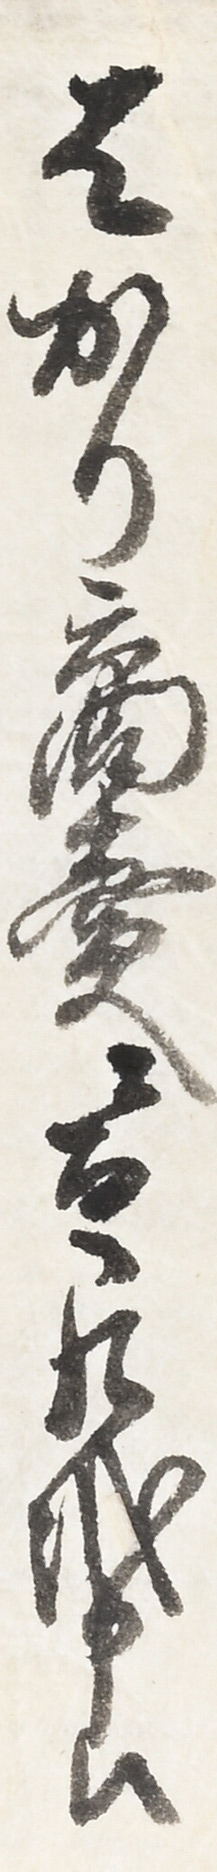はかり商売ニ而罷越申候
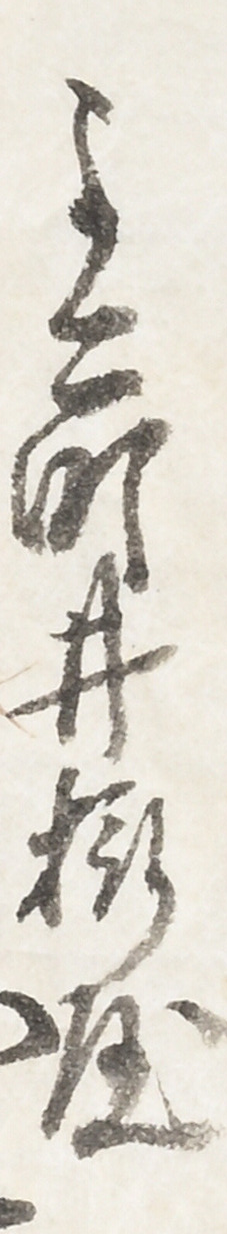よこ町井桁屋
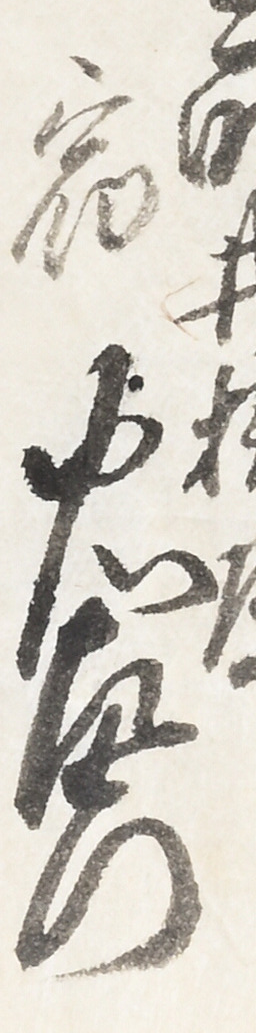宿忠左衛門
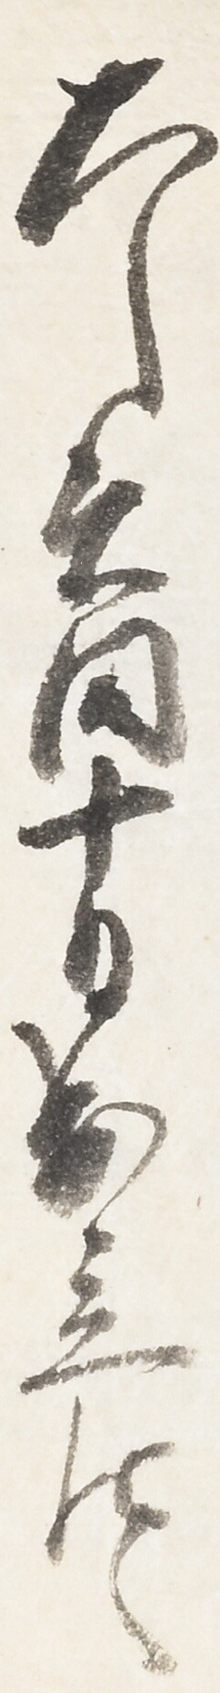右之者同十日出立仕候
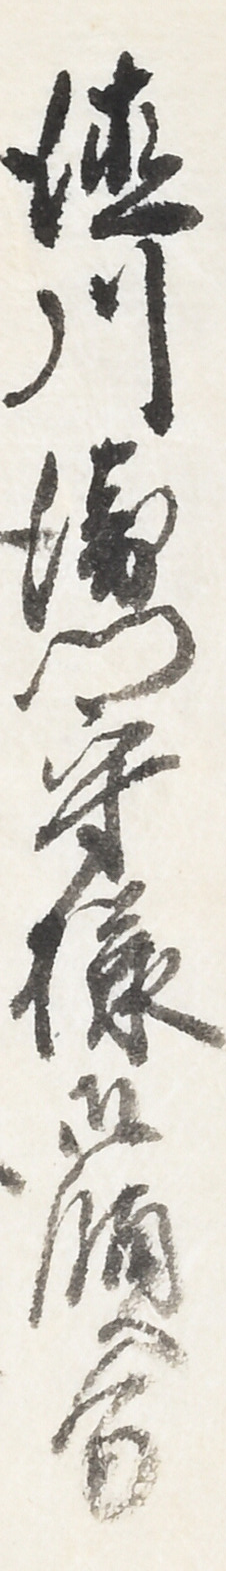徳川衛門守様御領分
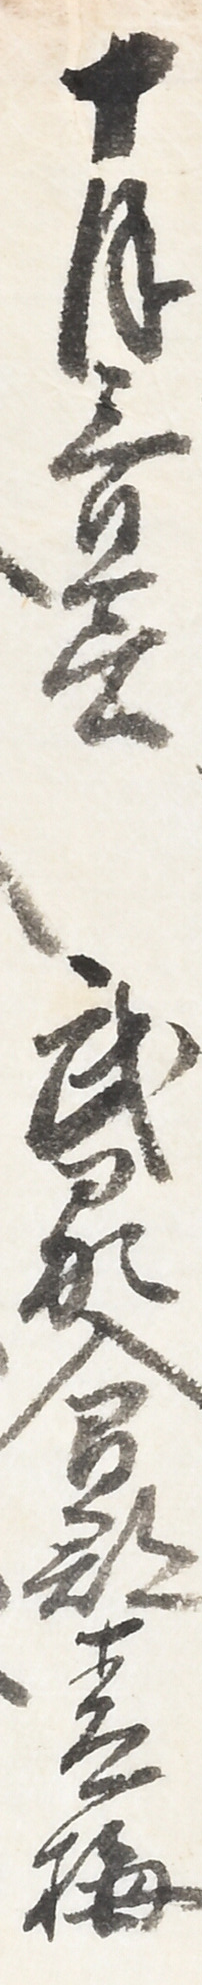十月三日着武州入間郡青梅
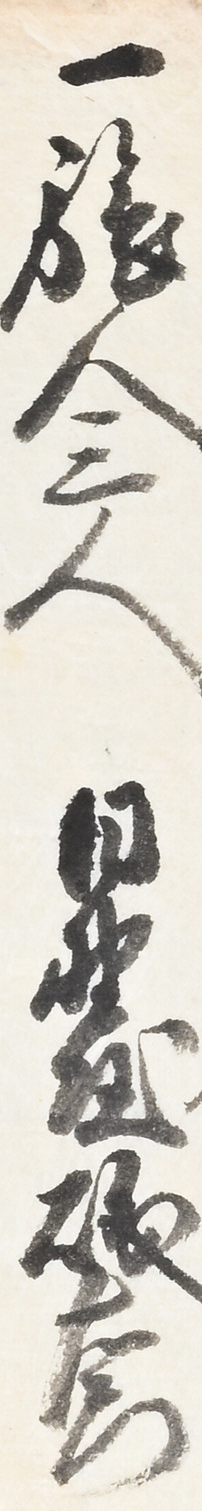一旅人三人日野屋磯右衛門
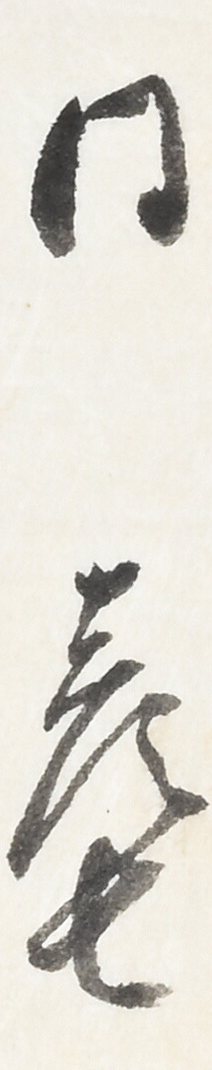同彦七
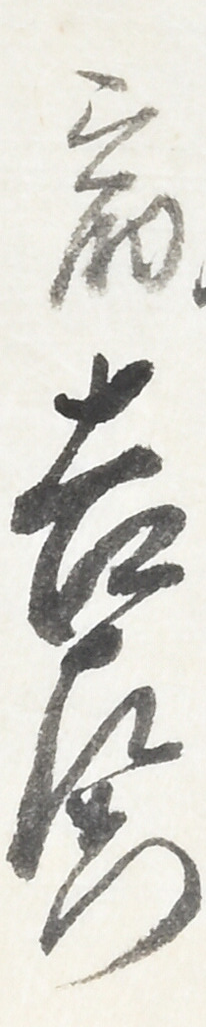宿吉左衛門
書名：旅人泊控帳
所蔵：伊那市立高遠町図書館・合同会社AMANE
